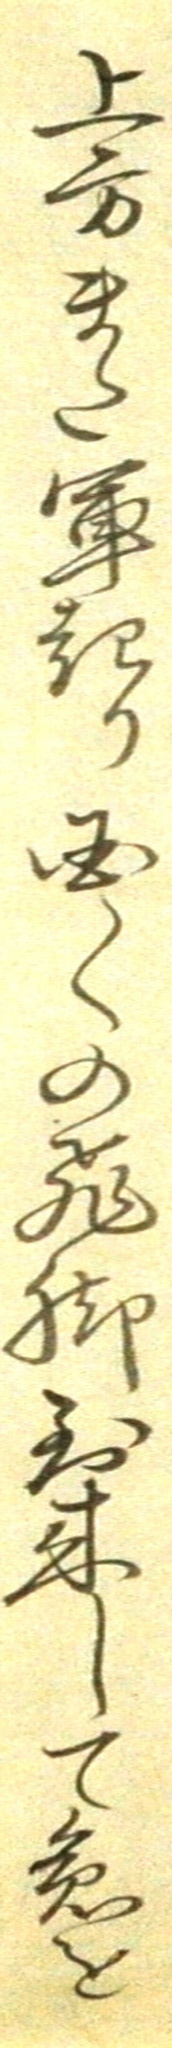上方また軍起り国〳〵の飛脚到来して急を
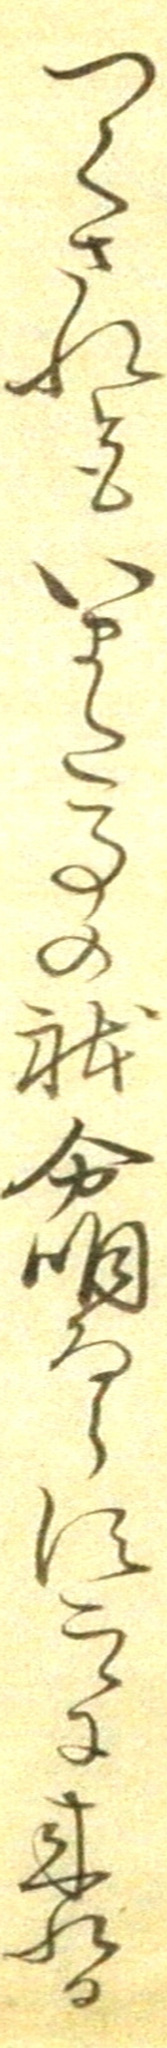つくされともいまた事の体分明ならすこゝに来れる
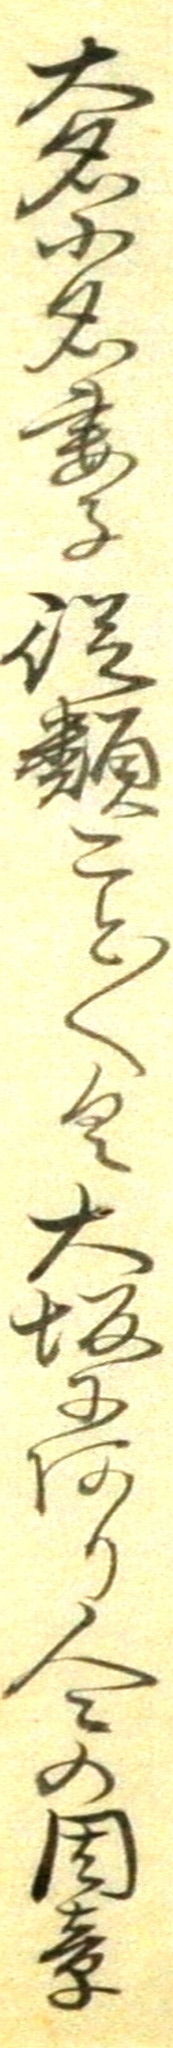大名小名妻子従類こと〳〵く大坂にあり人々の周章
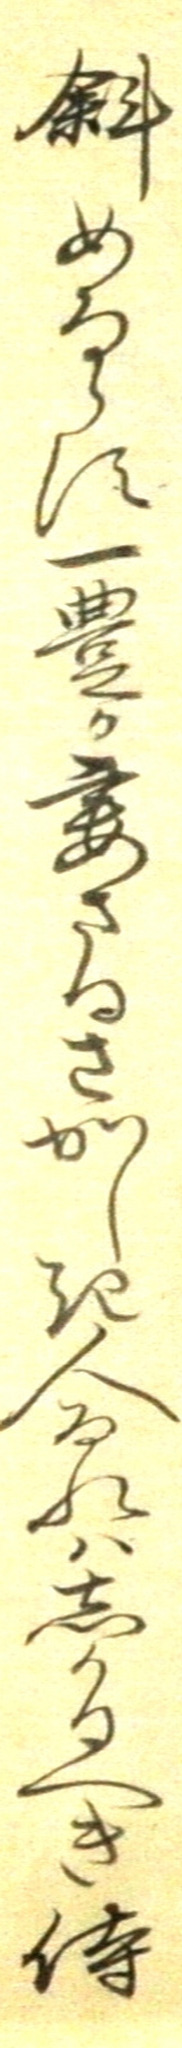斜めならす一豊か妻さるさかしき人なれはしかるへき侍

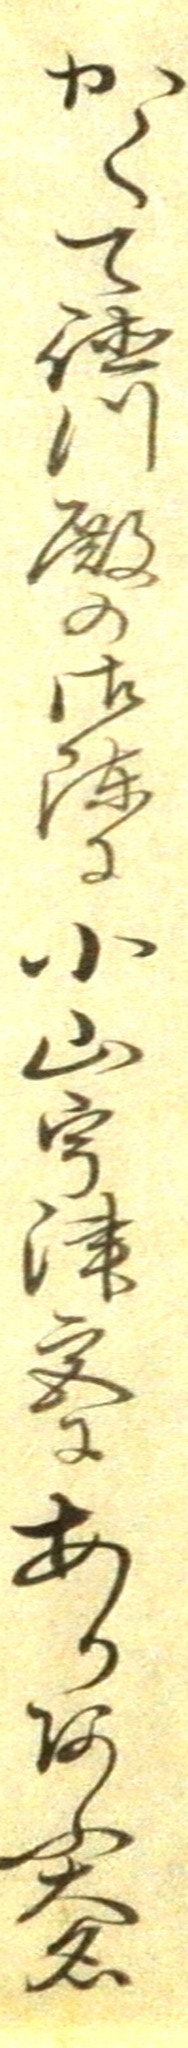かくて徳川殿の御陣に小山宇津宮にありあふ大名
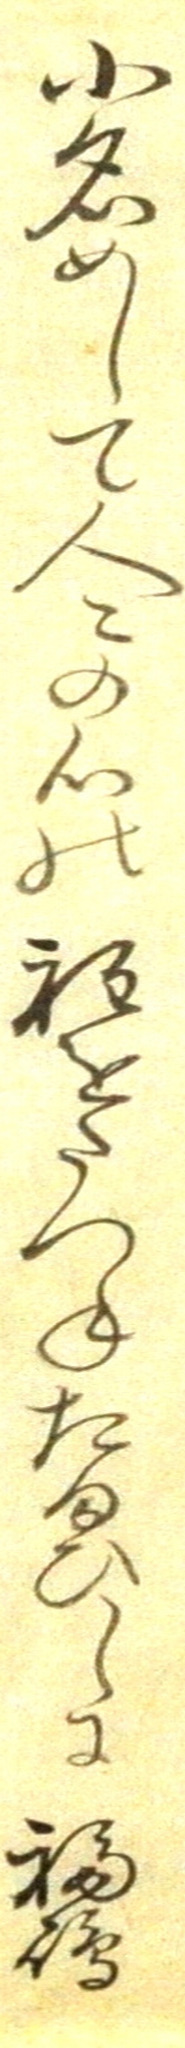小名めして人々の心の程をたつねたまひしに福島
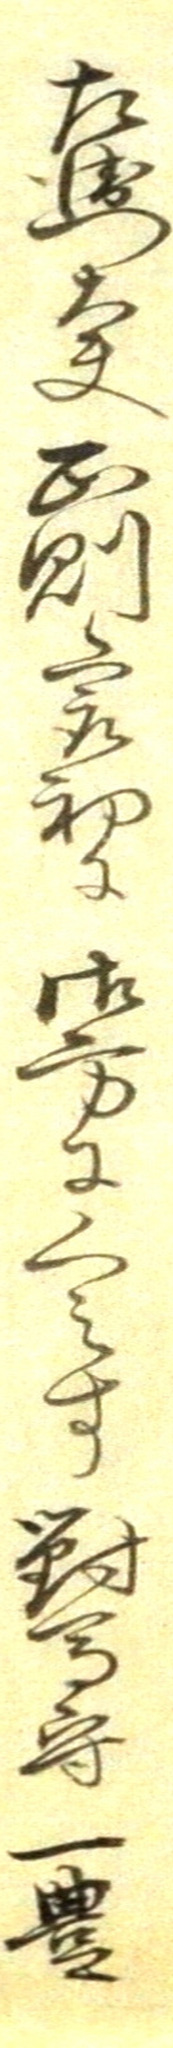左衛門大夫正則最初に御方にくみす対馬守一豊
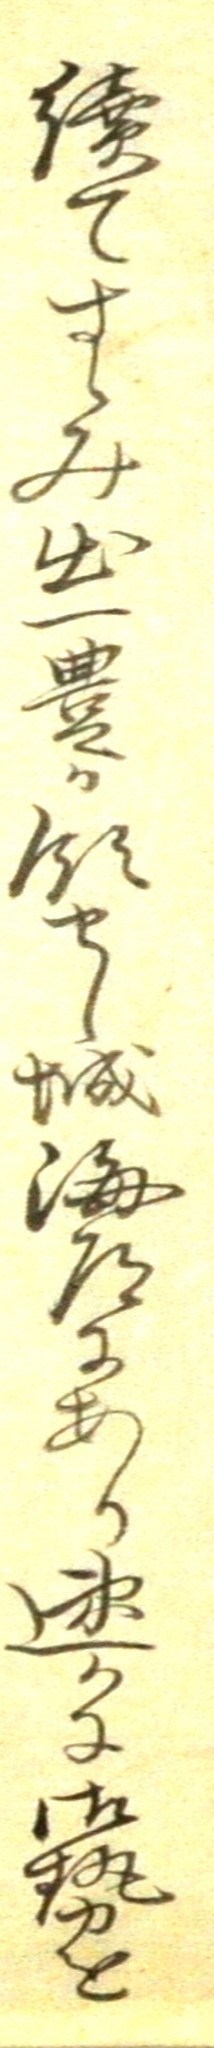続てすゝみ出一豊か領せし城海道にあり速かに御勢を
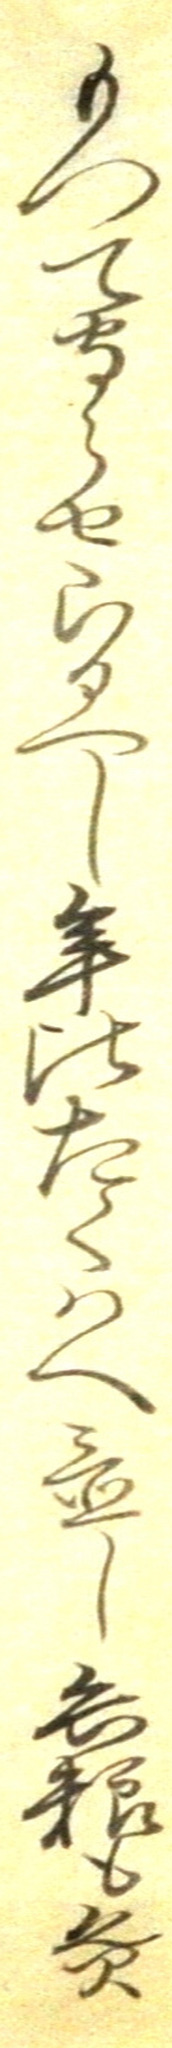もつて守らせらるへし年比たくはへ置し兵粮も
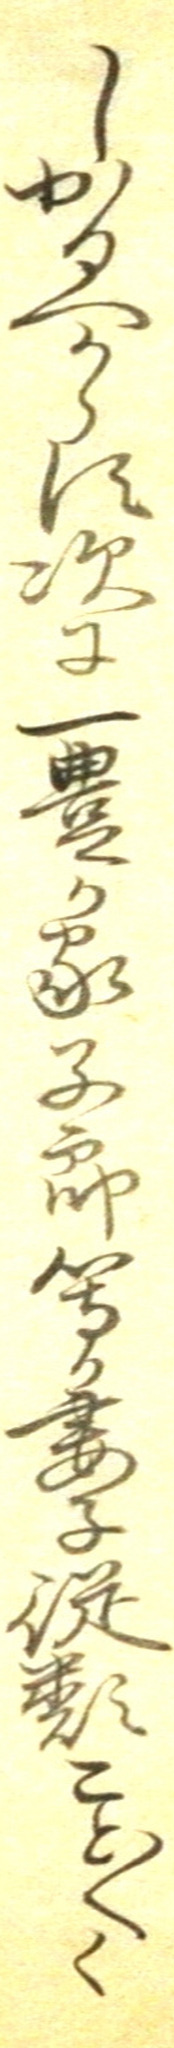しかるへからす次に一豊か家子郎等か妻子従類こと〳〵く
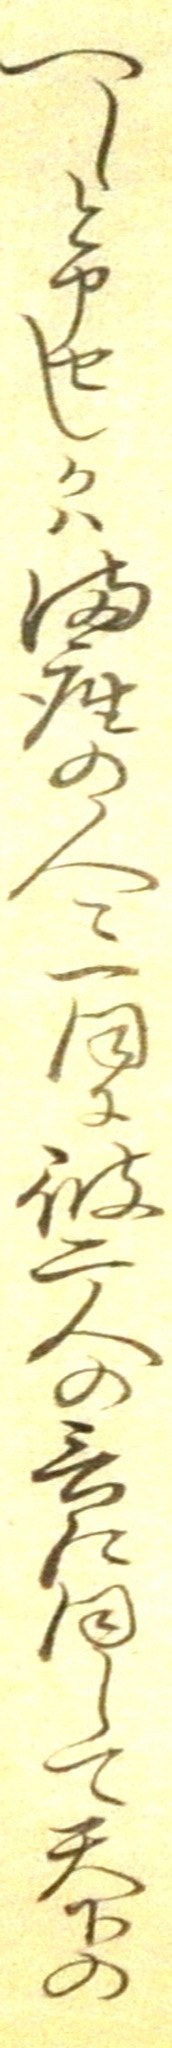へしと申せしかは満座の人々一同に彼二人の兵に同して天下の
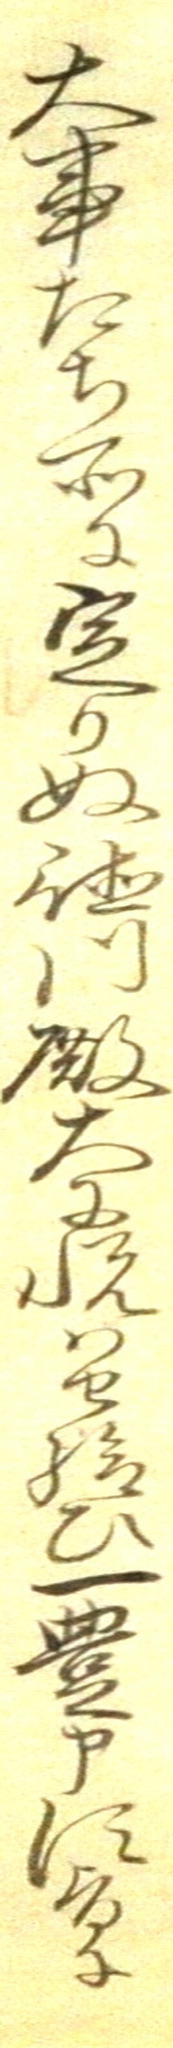大事たち所に定りぬ徳川殿大に悦はせ給ひ一豊申す旨に

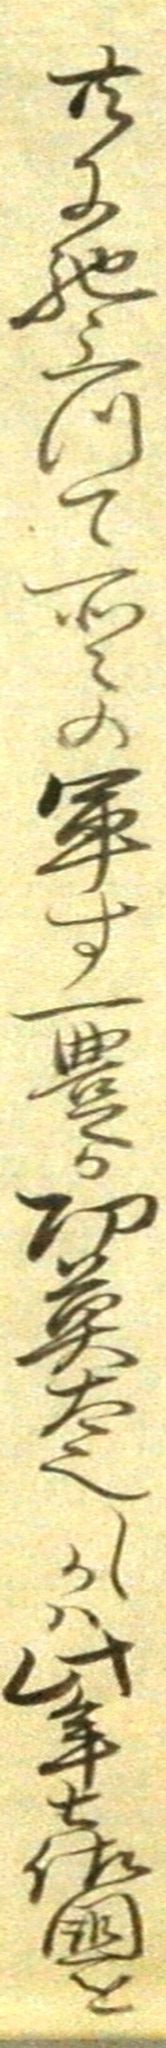供に馳上つて所々の軍す一豊か功莫太也しかは此年土佐国を
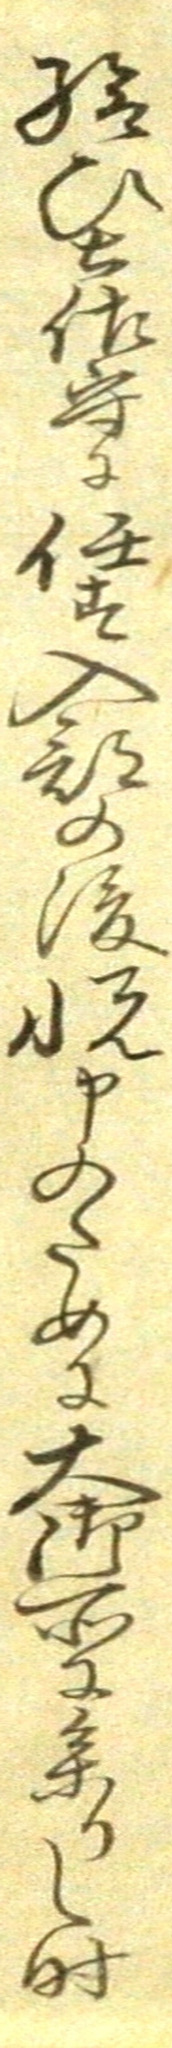給ひ土佐守に任す入部の後悦申のために大御所に参りし時
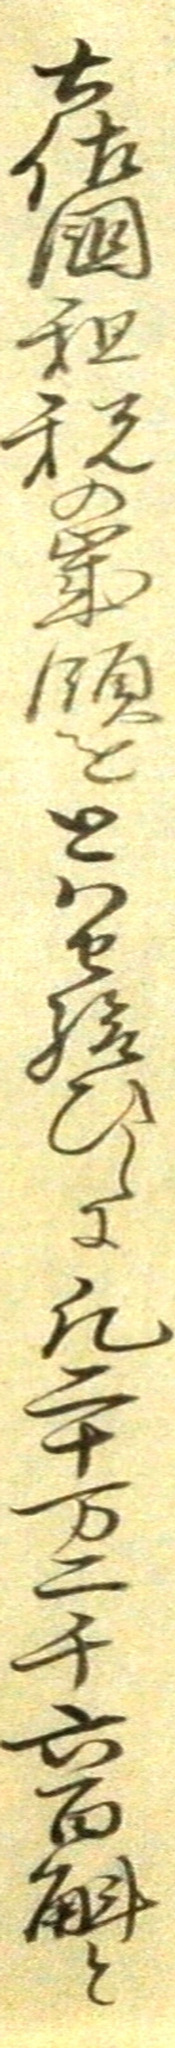土佐国租税の歳領をとはせ給ひしに凡二十万二千六百斛と
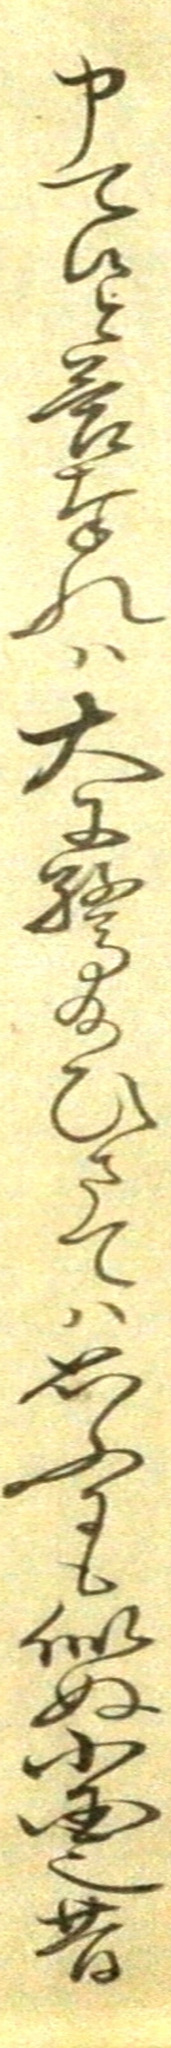申て候と答奉れは大に驚給ひさては思ふにも似ぬ小国也昔
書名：藩翰譜（七・上）
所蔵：伊那市立高遠町図書館・合同会社AMANE
